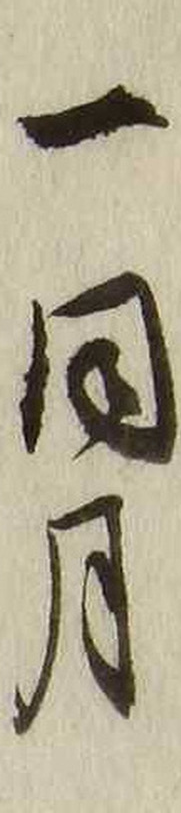一同月
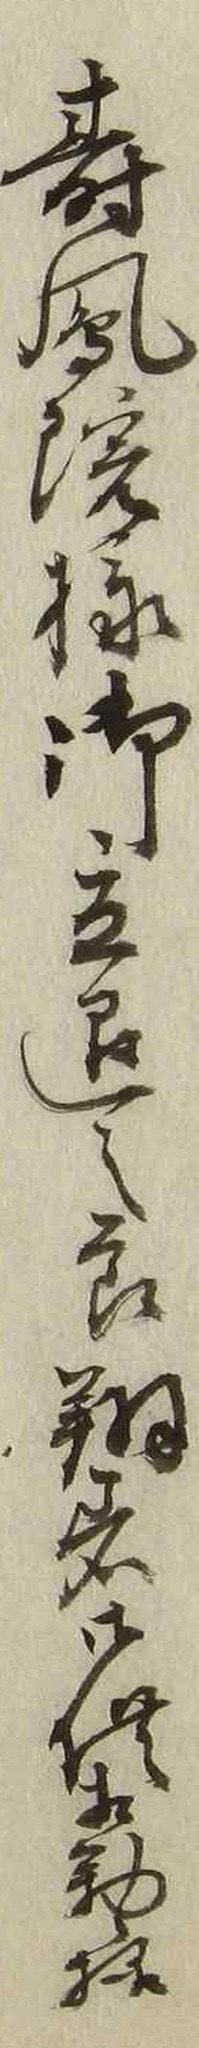寿鳳院様御立退之節翔着御供相勤候様
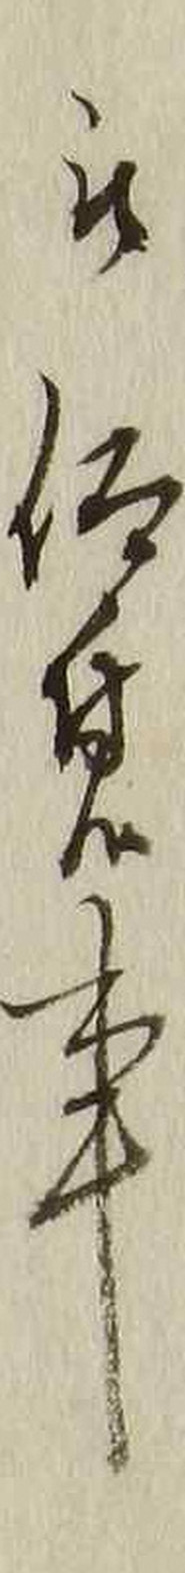被仰付候事
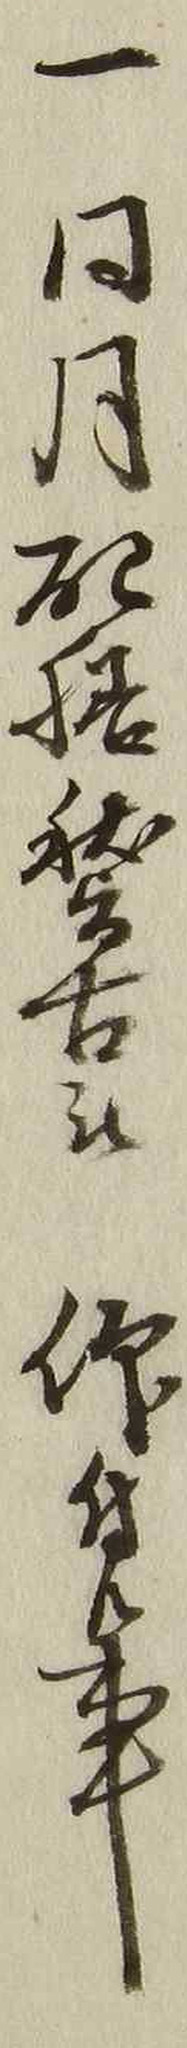一同月配膳稽古被仰付候事
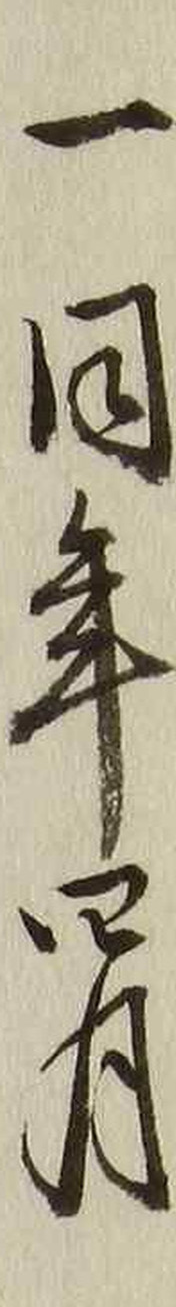一同年四月
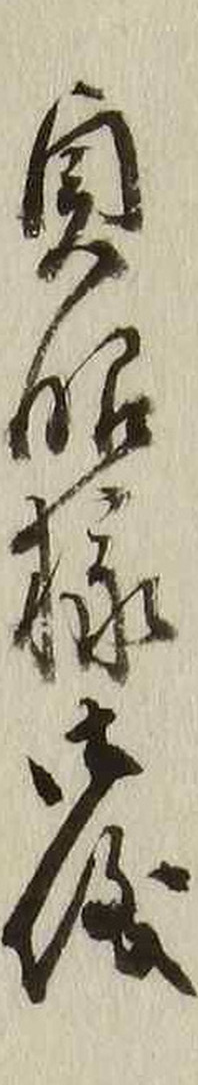貞昭様御儀
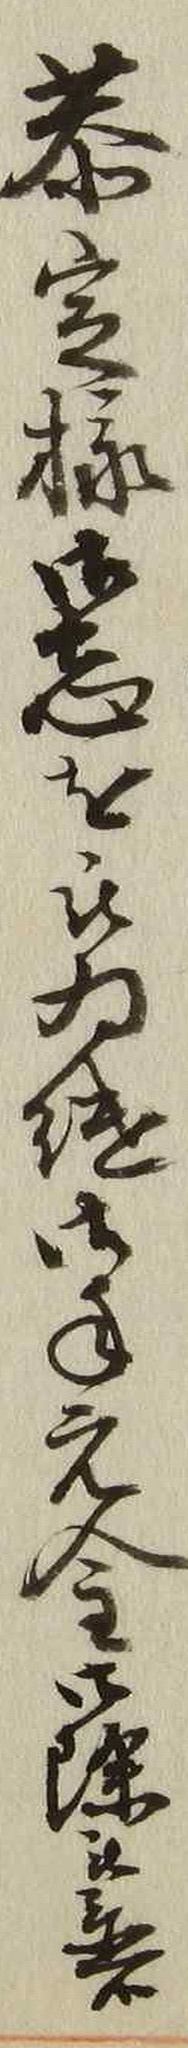恭定様御志を被為継御手元金御除被置候
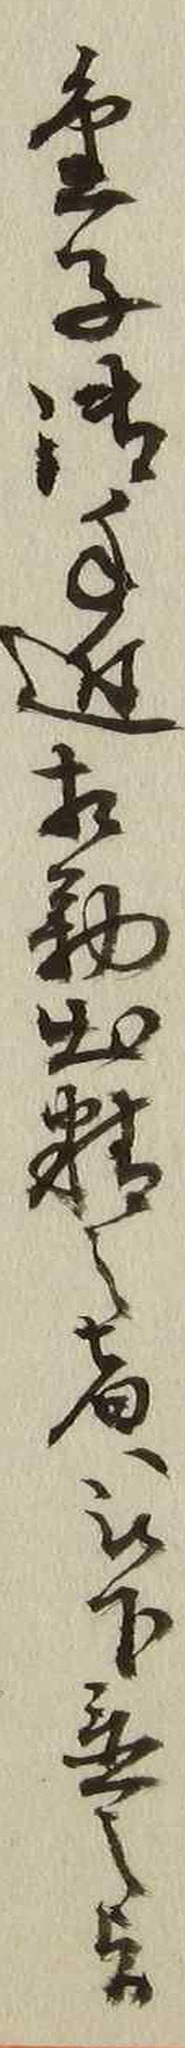金子御手近相勤出精之者へ被下置之旨
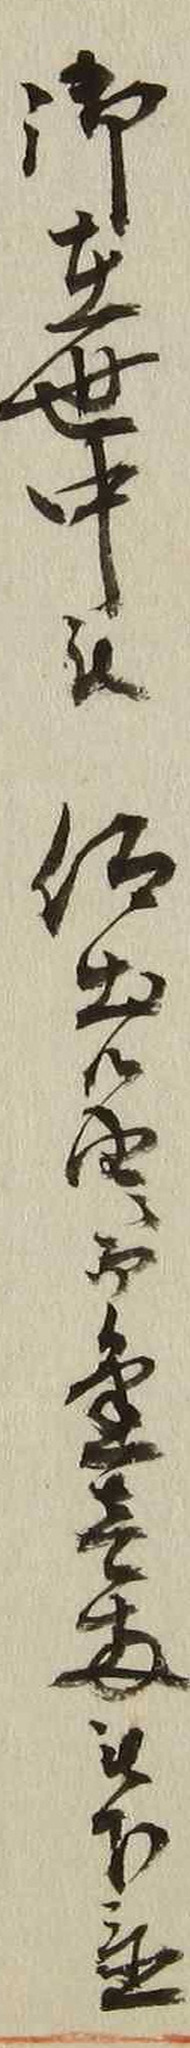御在世中被仰出候由ニ而金壱両被下置
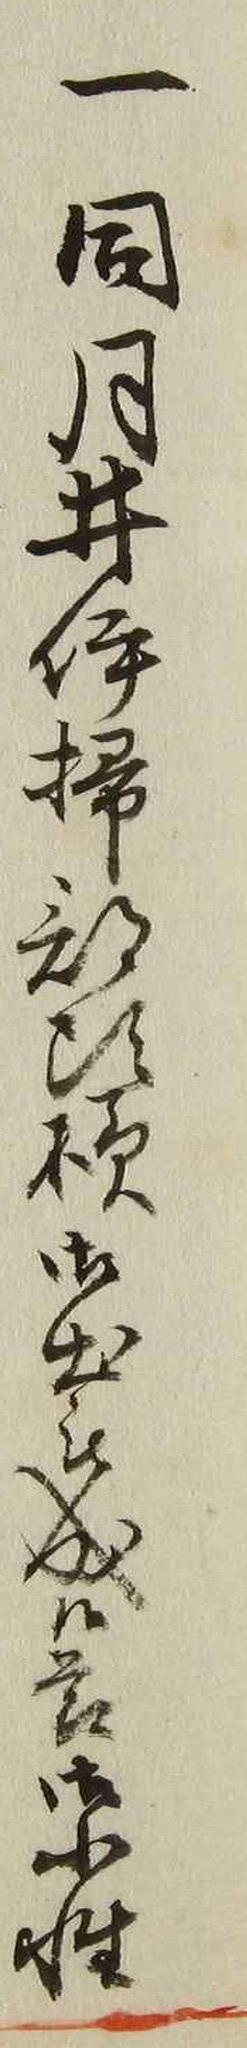一同月井伊掃部頭様御出被成候節御小性
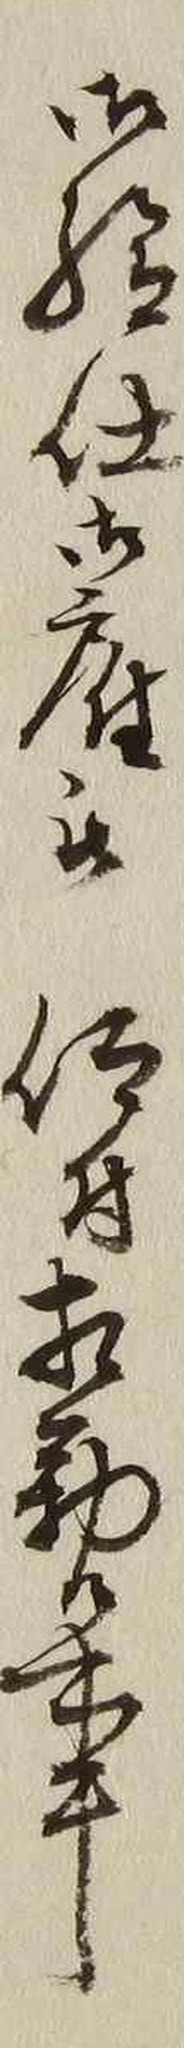御給仕御雇被仰付相勤候事
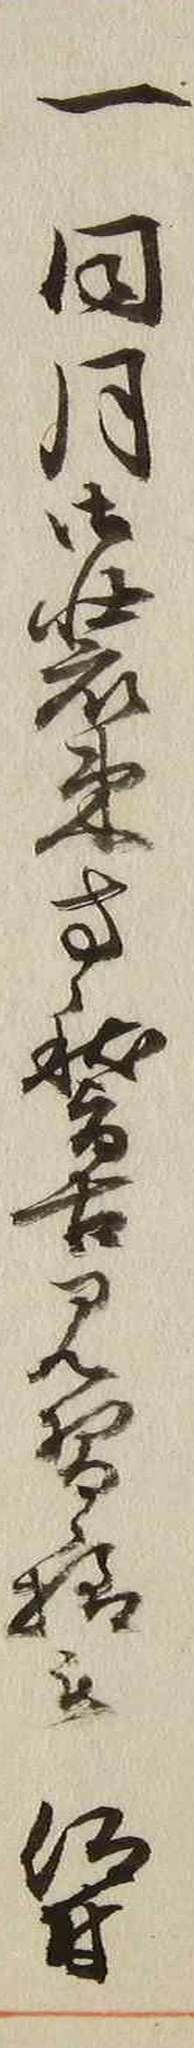一同月御装束方稽古見習候様被仰付
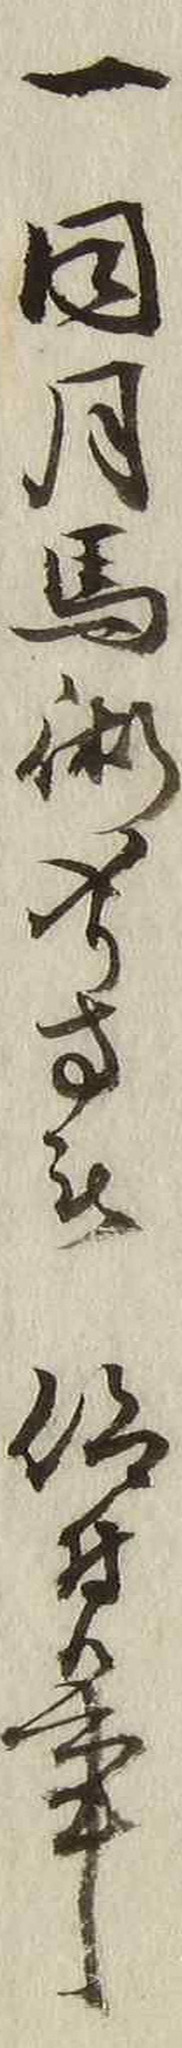一同月馬術〆り方被仰付候事
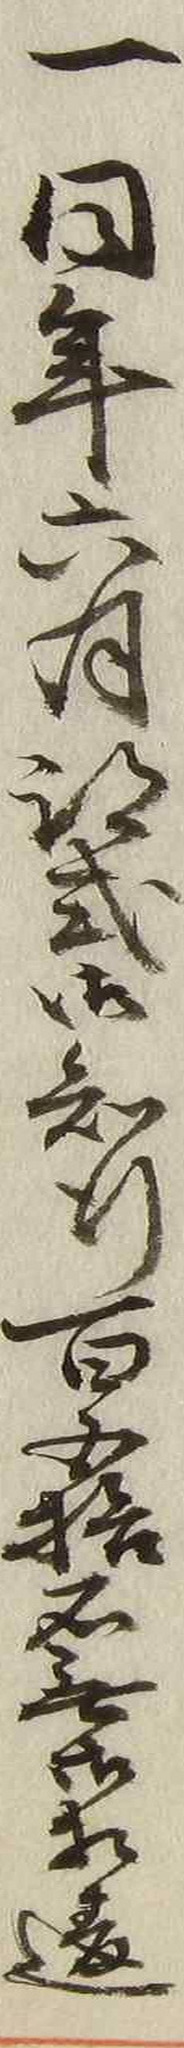一同年六月跡式御知行百五拾石無御相違
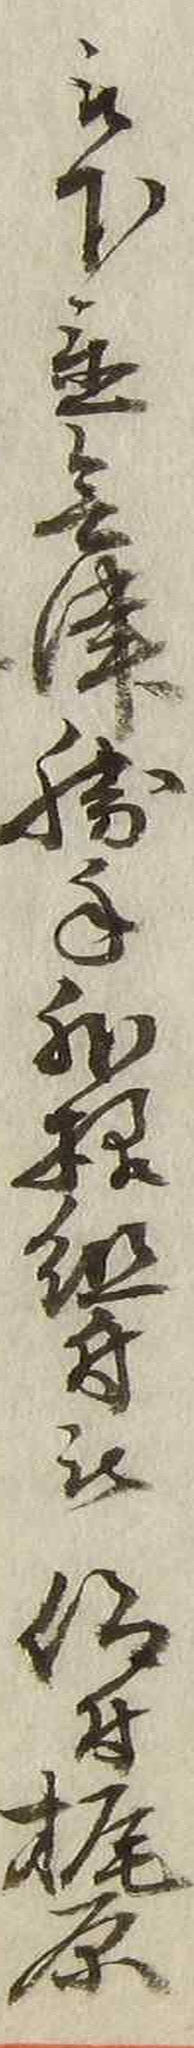被下置会津勝手外様組付被仰付梶原
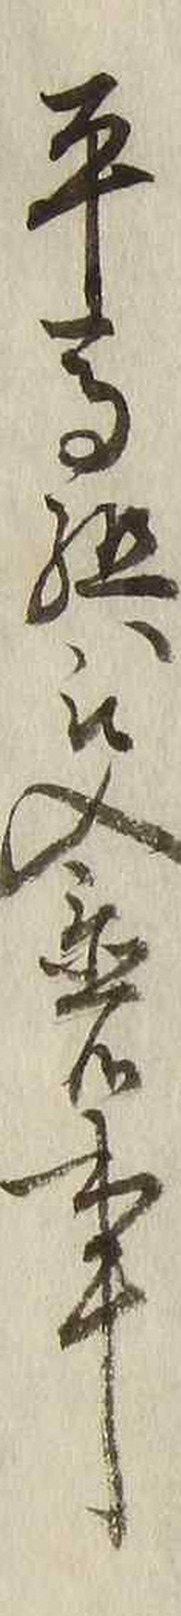平馬組へ被入置候事
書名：諸士系譜　巻之23　い之部23
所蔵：会津若松市立会津図書館
